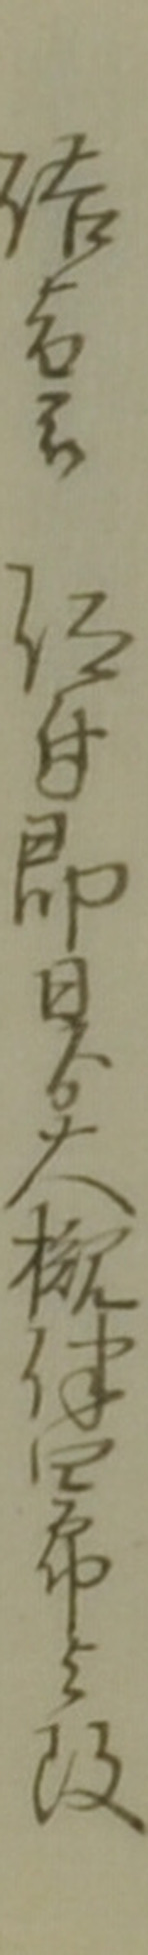詰旨被仰付即日ゟ大槻伴四郎与改
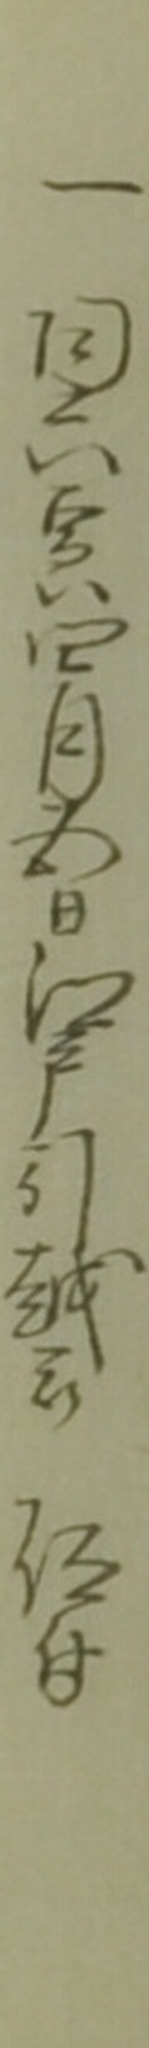一同六寅四月五日江戸引越被仰付
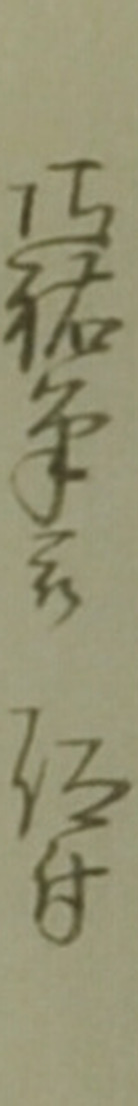御祐筆被仰付
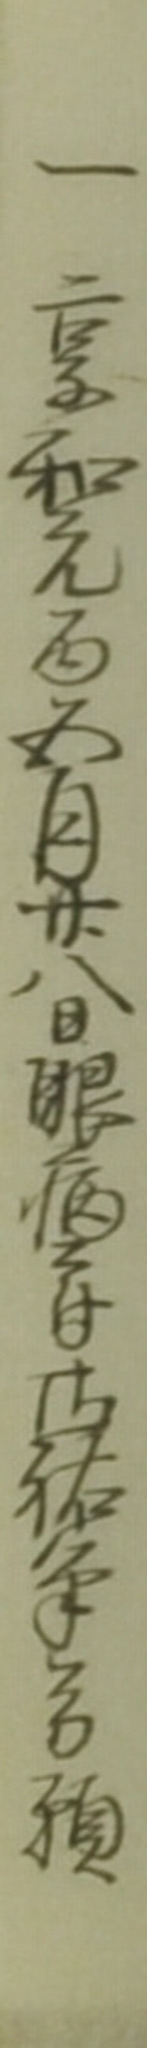一享和元酉五月廿八日眼病ニ付御祐筆方願

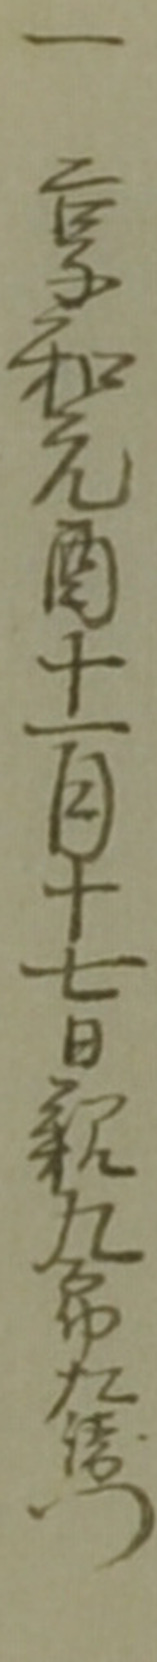一享和元酉十一月十七日親九郎左衛門
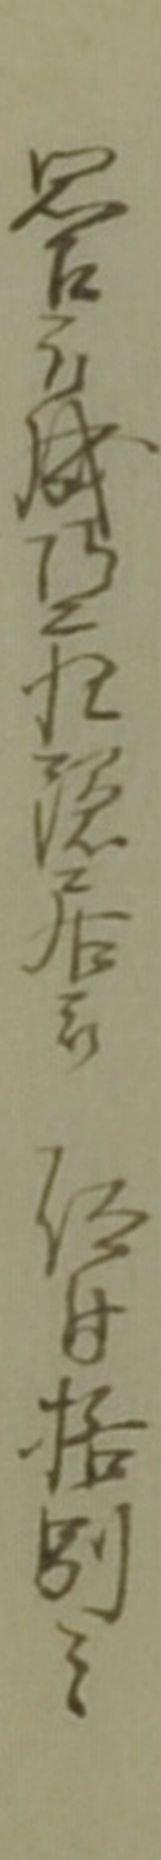思召被成御座隠居被仰付格別之
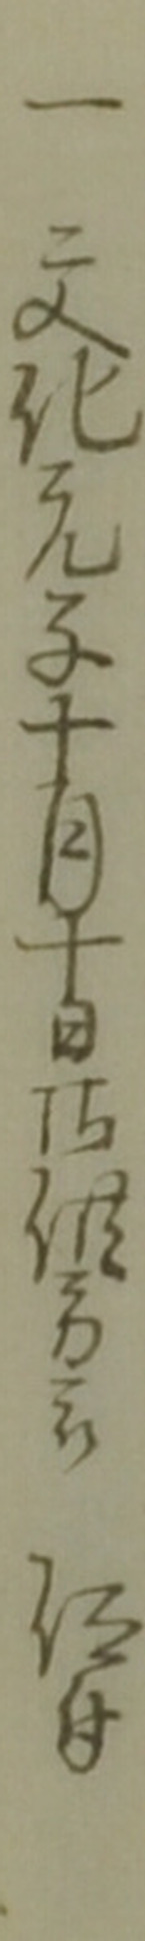一文化元子十月十日御供方被仰付
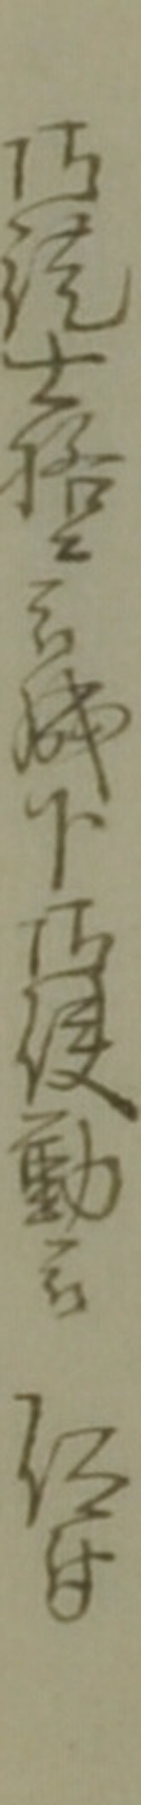御徒士格ニ被成下御使勤被仰付
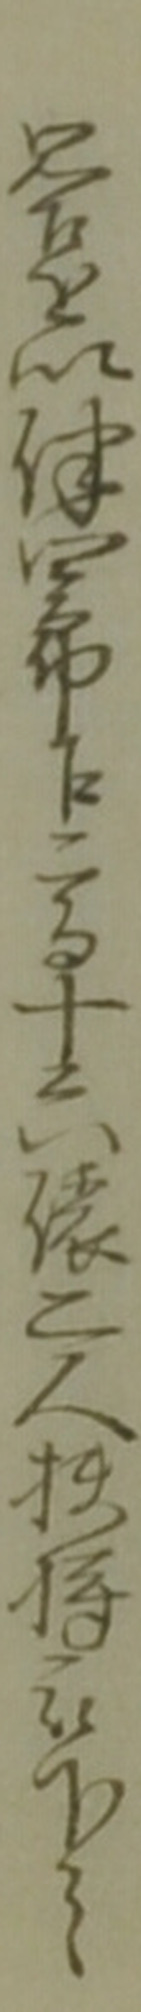思召を以伴四郎江高十六俵二人扶持被下之
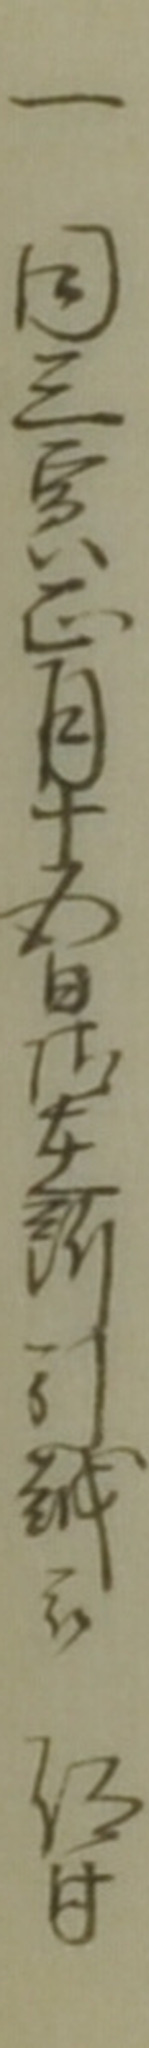一同三寅正月十五日御在所引越被仰付
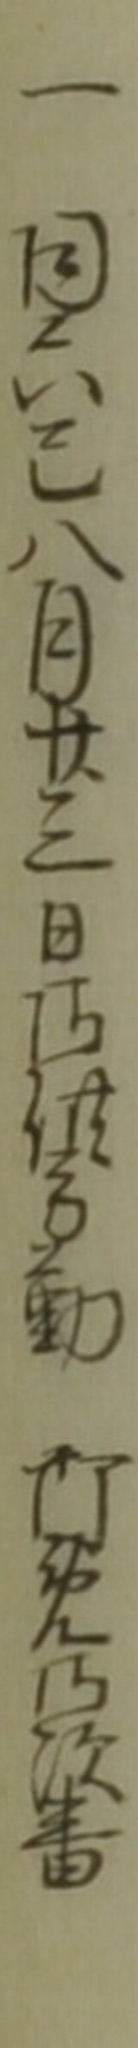一同六巳八月廿三日御供方勤御免御次番
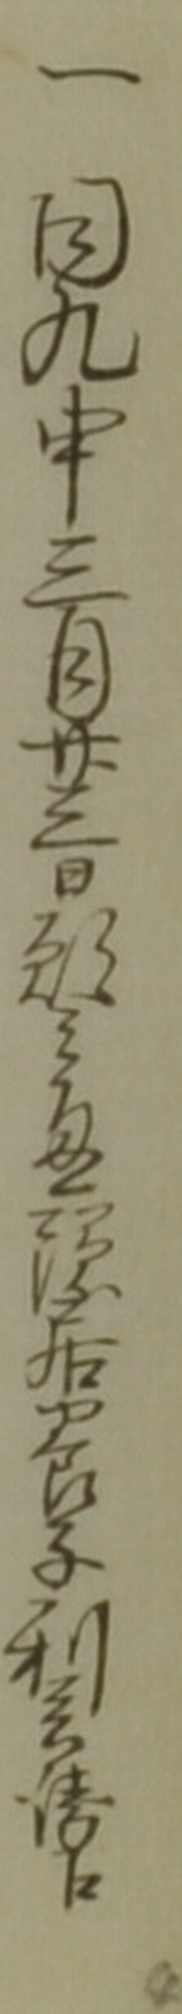一同九申三月廿三日願之通隠居養子利兵衛江
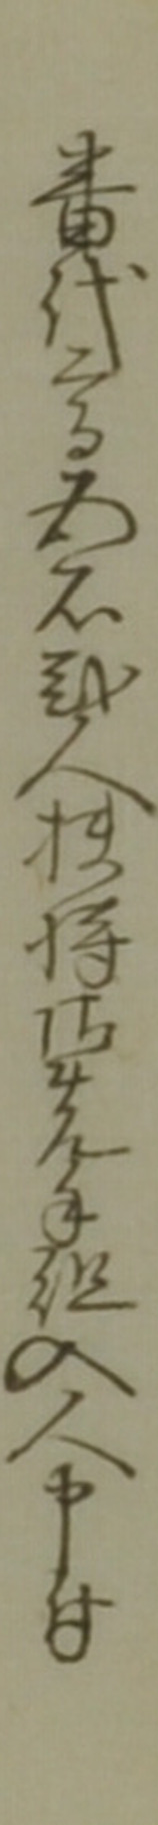番代高五石弐人扶持御先手組入人申付
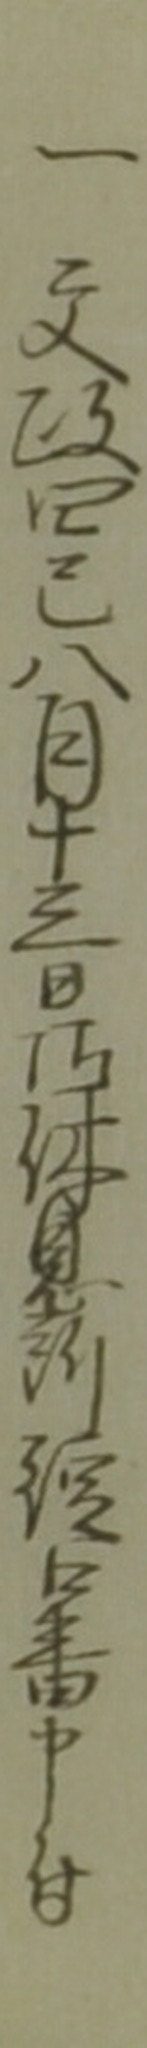一文政四巳八月十三日御休息所錠口番申付
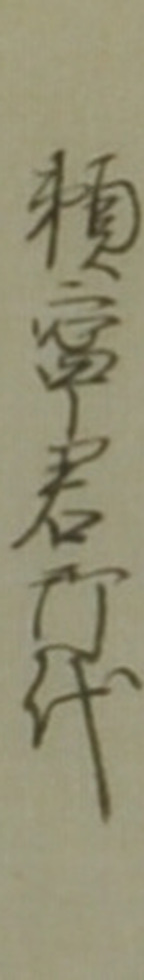頼寧君御代
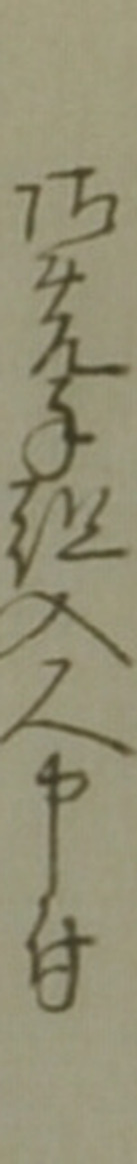御先手組入人申付
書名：無足諸士勤仕録（七）
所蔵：伊那市立高遠町図書館・合同会社AMANE
